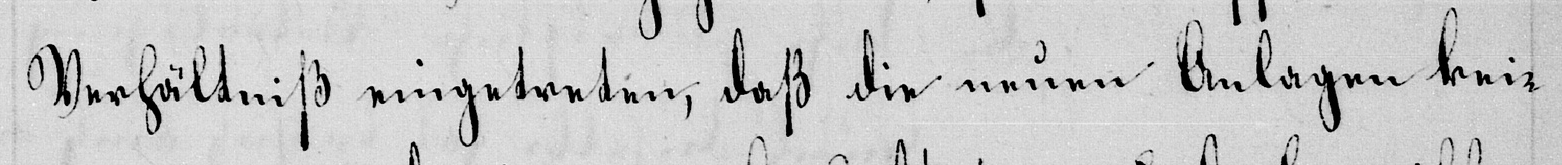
Verhältniß eingetreten, daß die neuen Anlagen kei¬
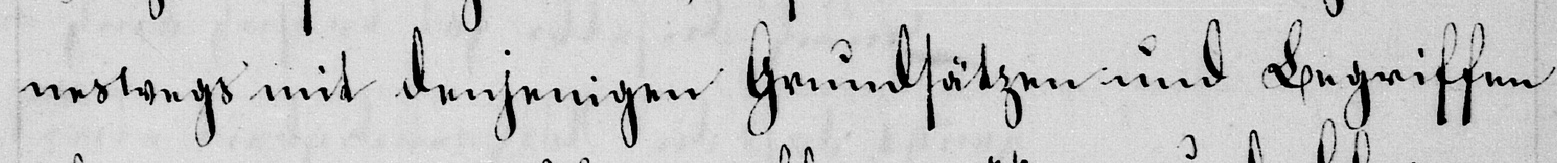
neswegs mit denjenigen Grundsätzen und Begriffen
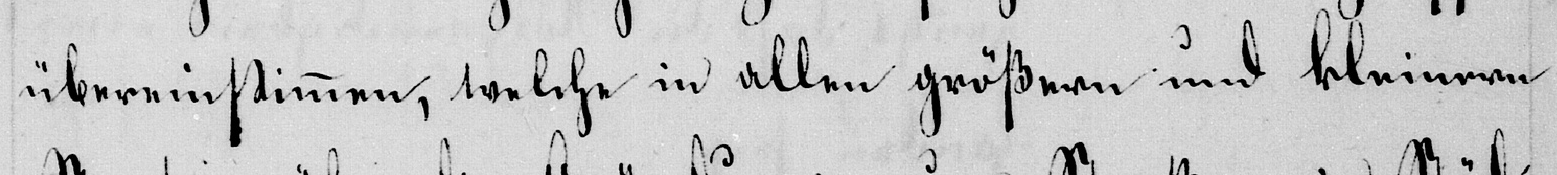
übereinstimmen, welche in allen größern und kleinern
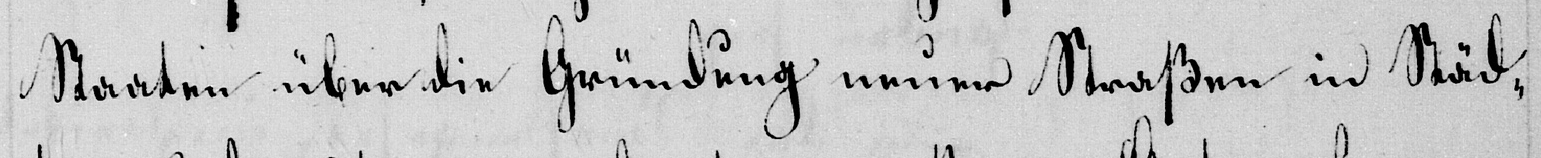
Staaten über die Gründung neuer Straßen in Städ¬
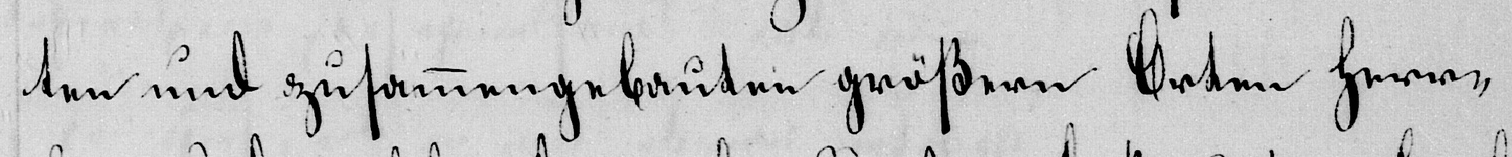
ten und zusammengebauten größern Orten herr¬
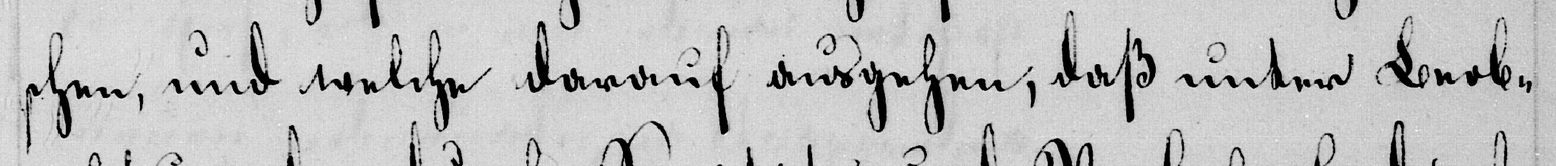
schen, und welche darauf ausgehen, daß unter Beob¬
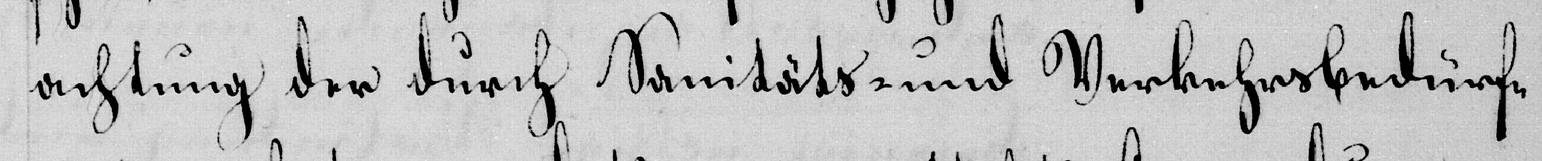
achtung der durch Sanitäts- und Verkehrsbedürf¬
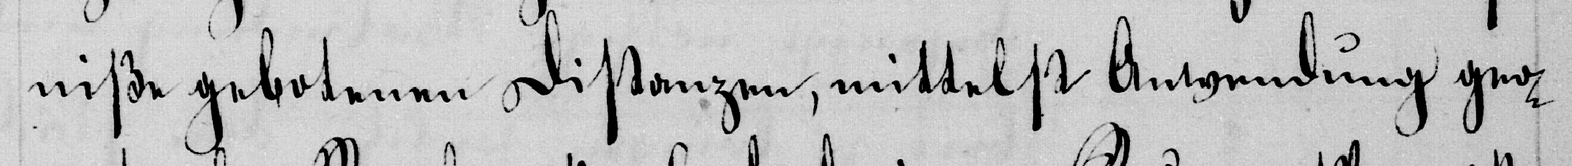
niße gebotenen Distanzen, mittelst Anwendung geo¬
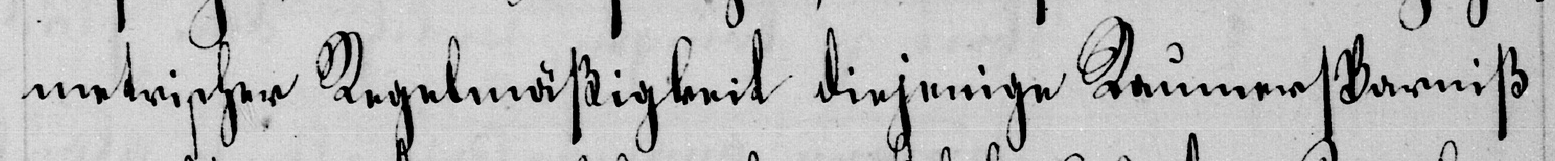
metrischer Regelmäßigkeit diejenige Raumersparniß
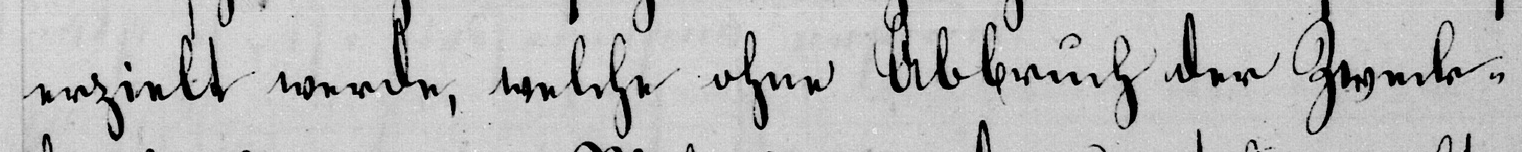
erzielt werde, welche ohne Abbruch der Zweck¬
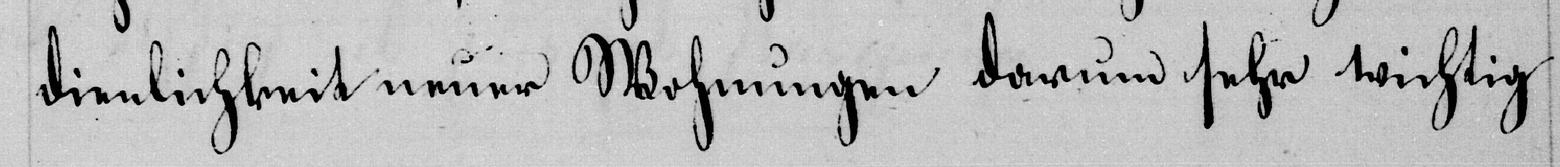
dienlichkeit neuer Wohnungen darum sehr wichtig
